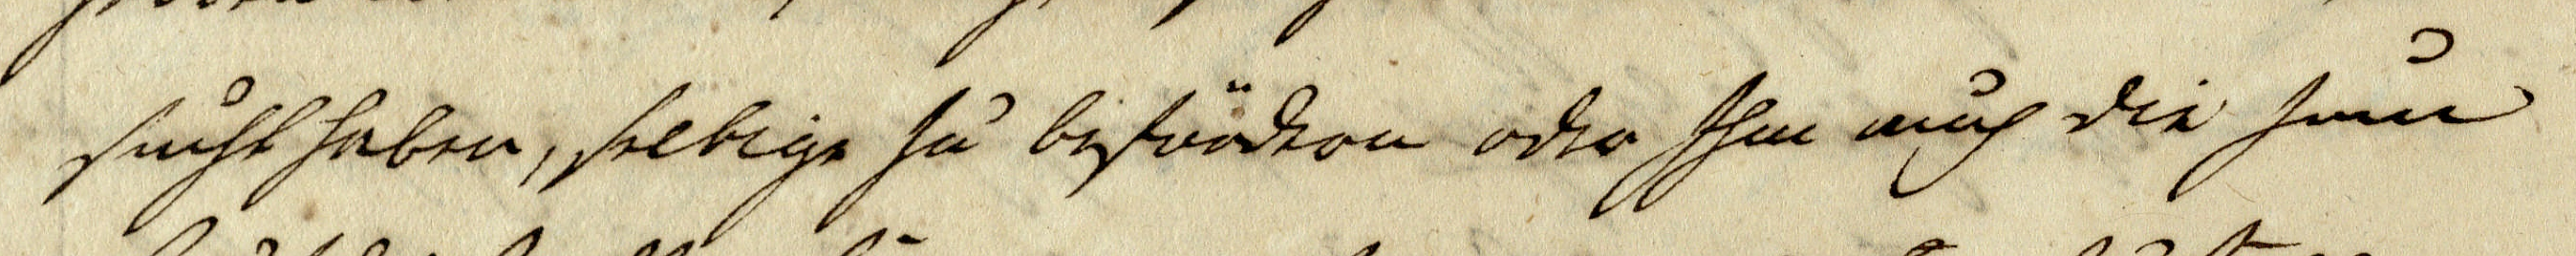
sucht haben, selbige zu befördern oder Ihm auch die zum
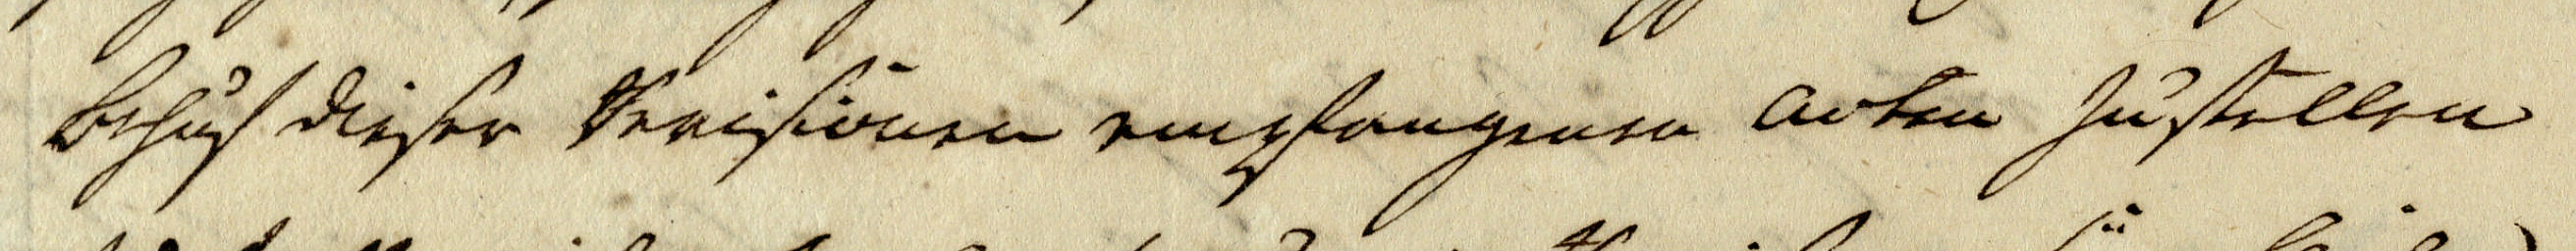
Behuf dieser Revisionen empfangenen Acten zustellen
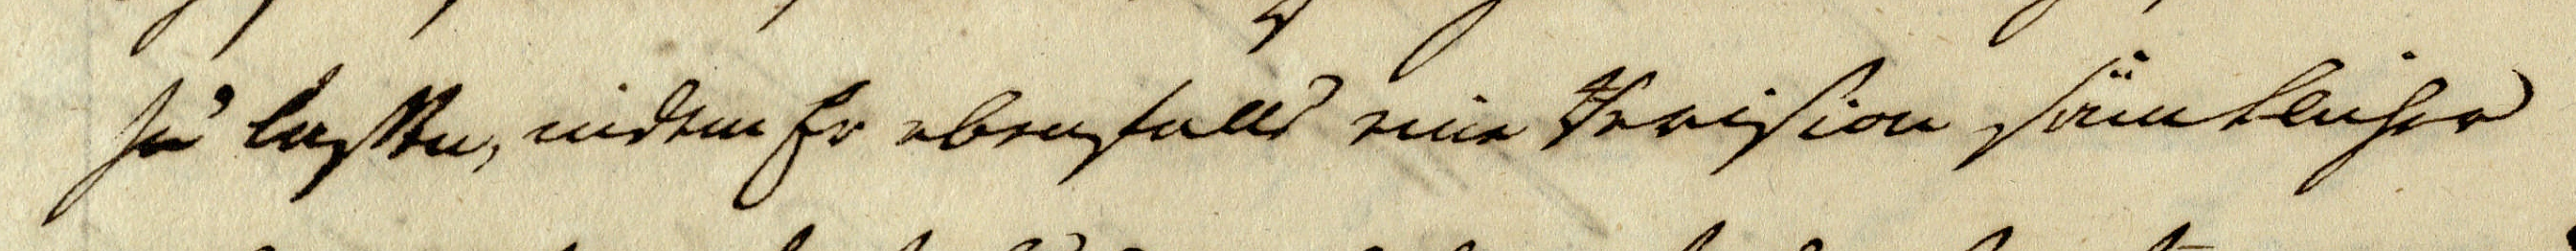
zu lassen, indem Er ebenfalls eine Revision sämtlicher
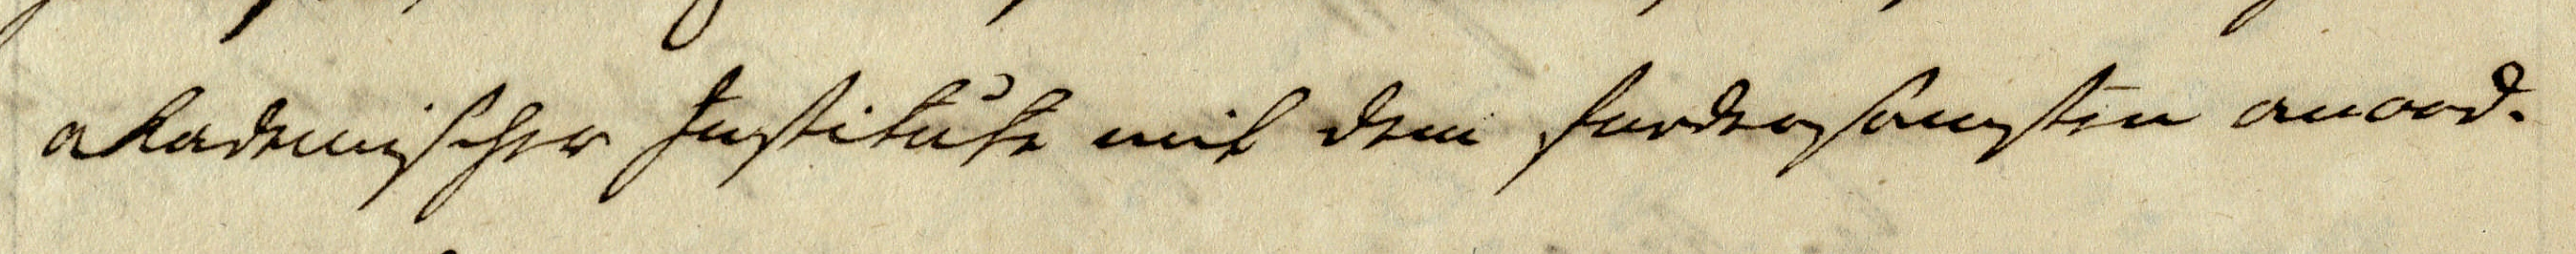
akademischer Institute mit dem fordersamsten anord¬
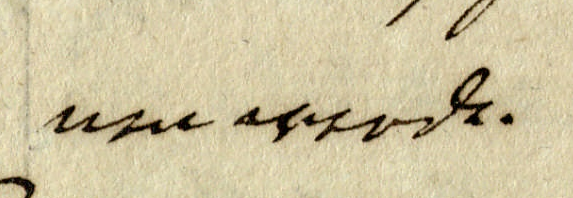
nen werde.
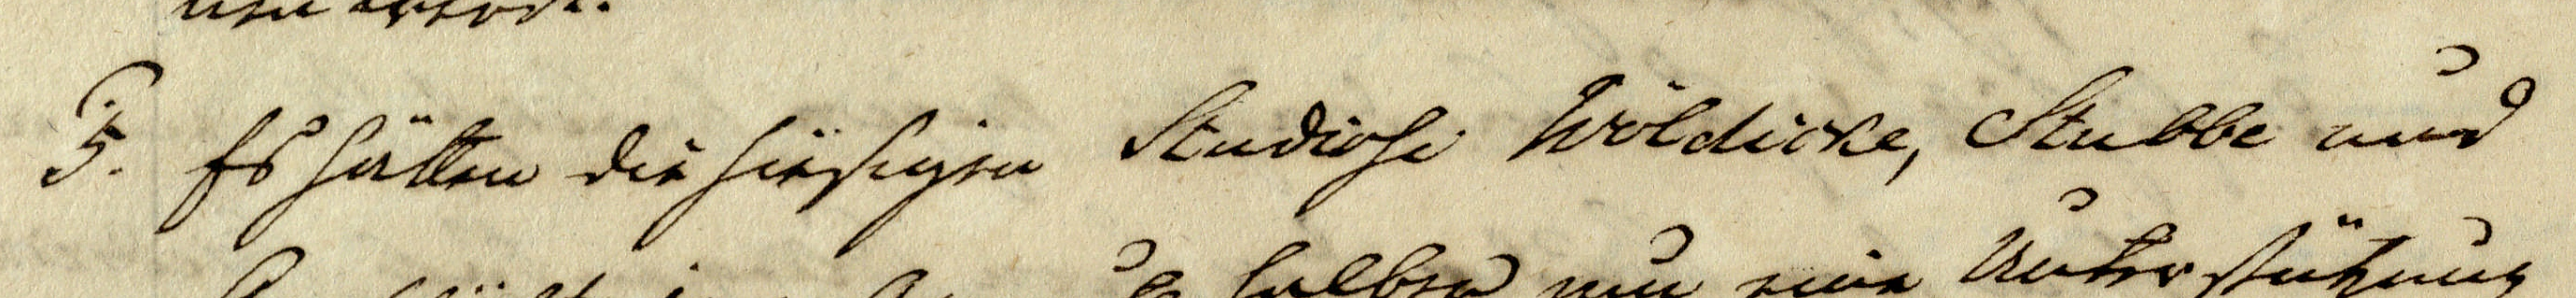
5. Es hätten die hiesigen Studiosi Wöldicke, Stubbe und
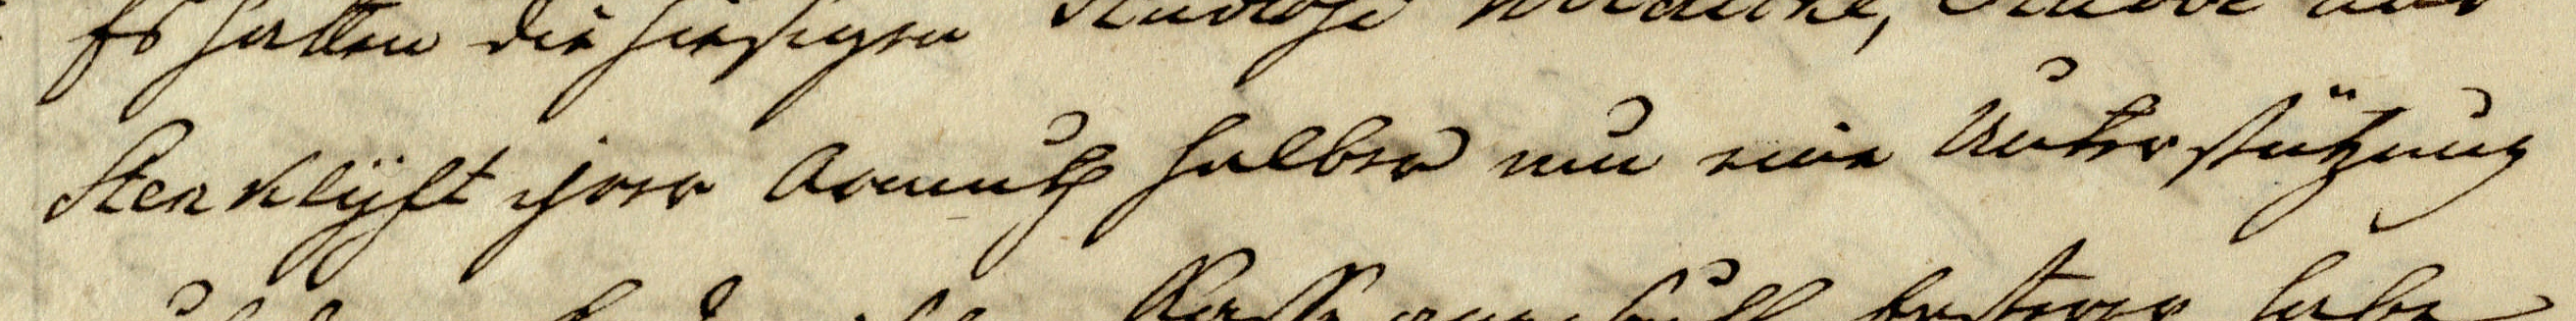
Stenklÿft ihrer Armuth halber um eine Unterstützung
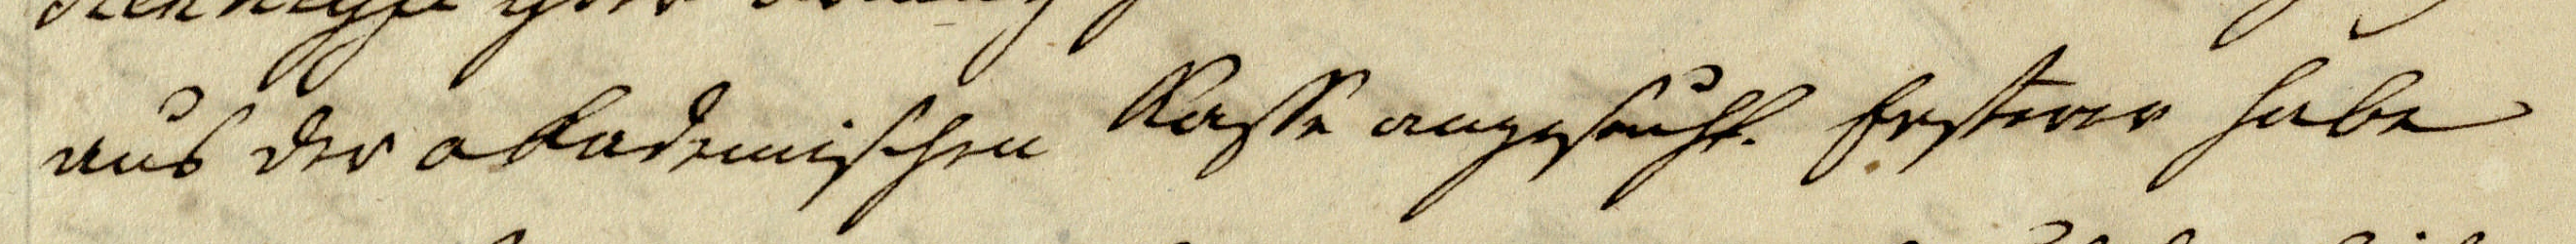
aus der akademischen Kasse angesucht. Ersterer habe
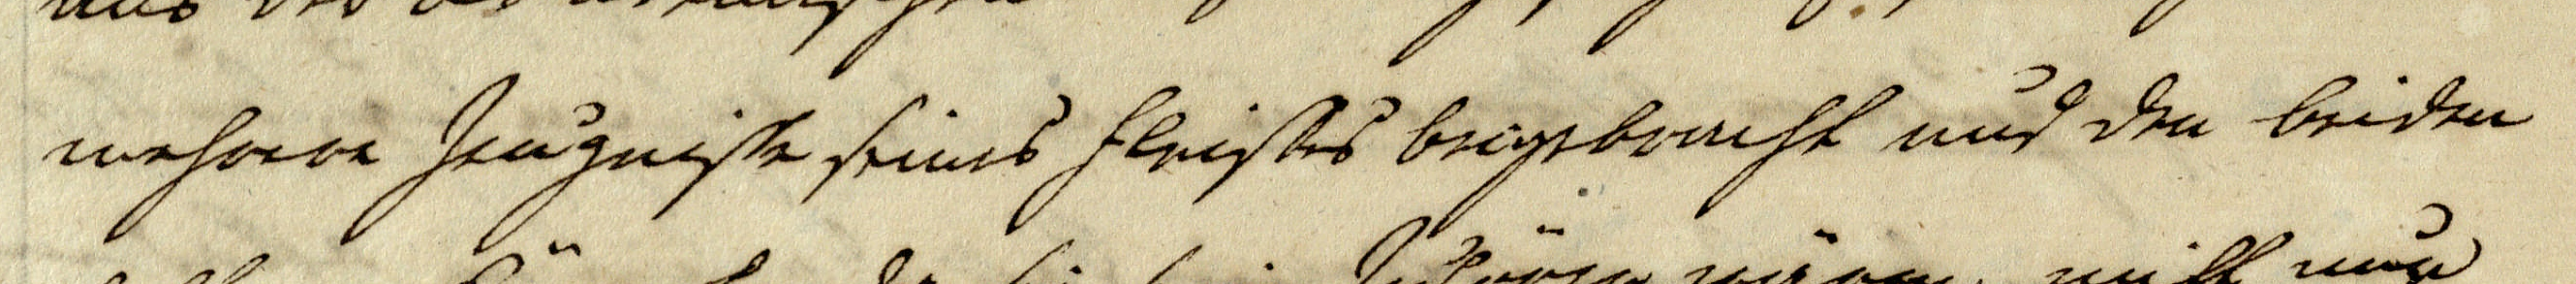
mehrere Zeugnisse seines Fleisses beigebracht und den beiden
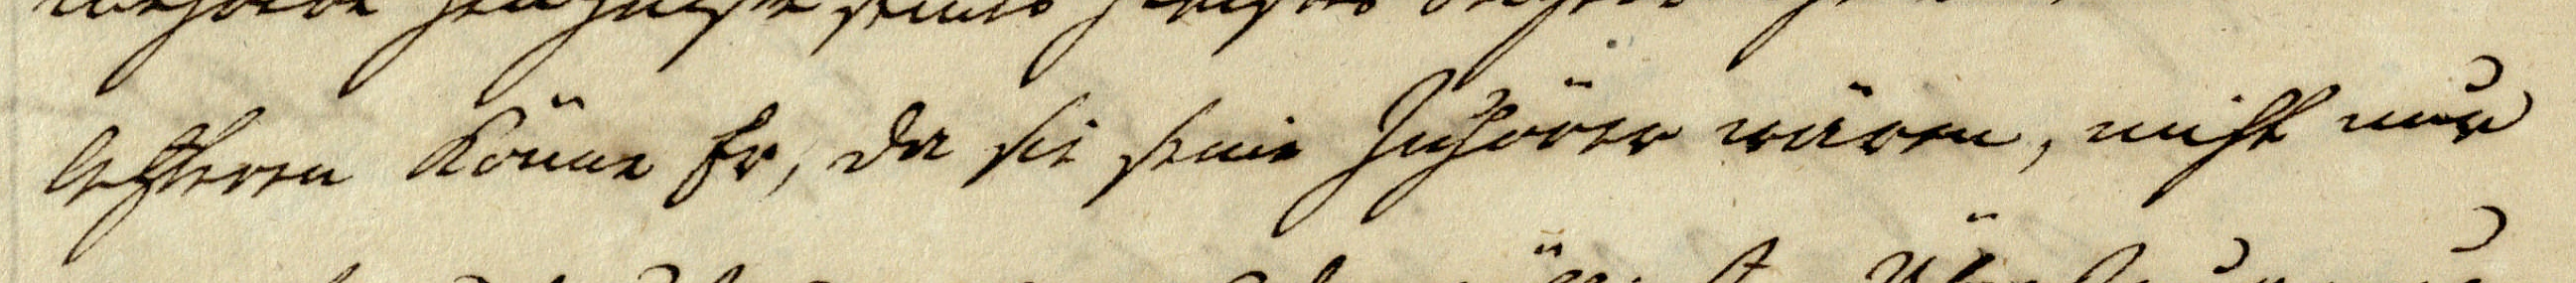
letzteren könne Er, da sie seine Zuhörer wären, nicht nur
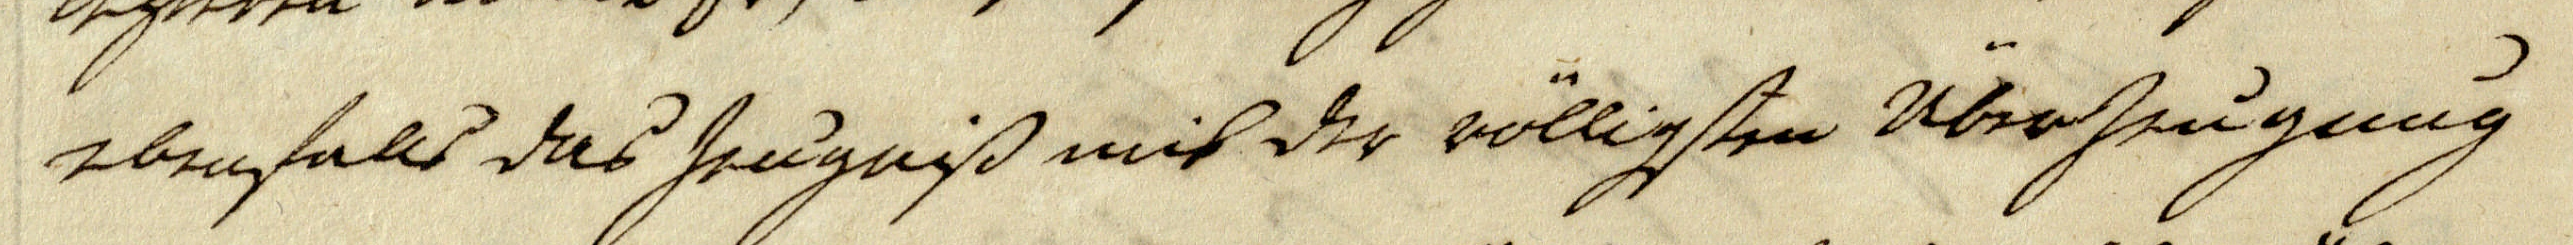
ebenfalls das Zeugniß mit der völligsten Überzeugung
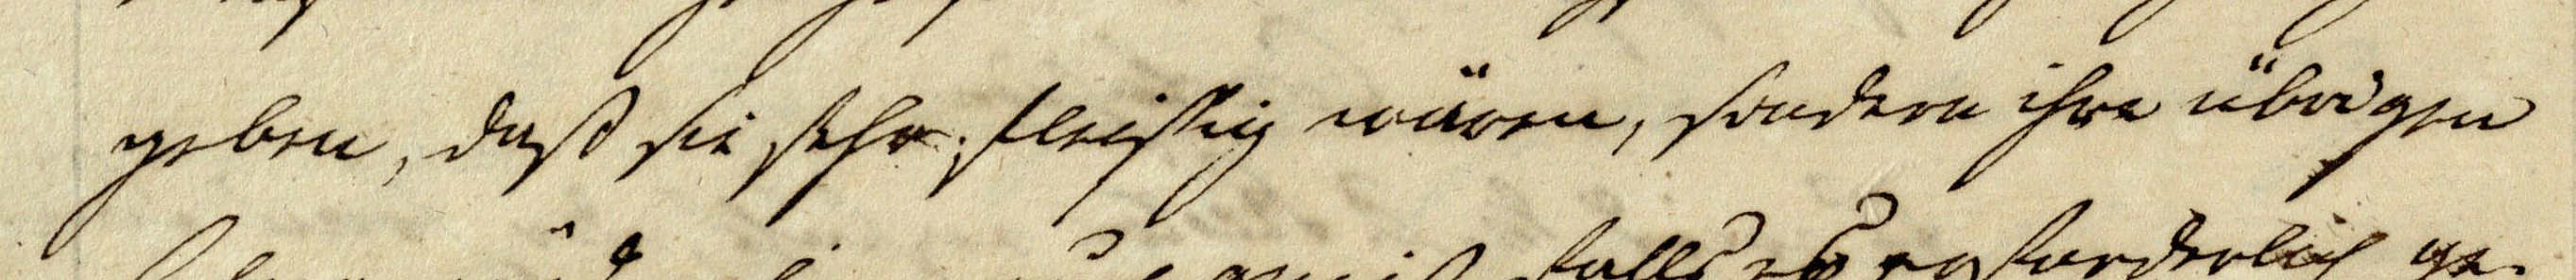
geben, daß sie sehr fleissig wären, sondern ihre übrigen
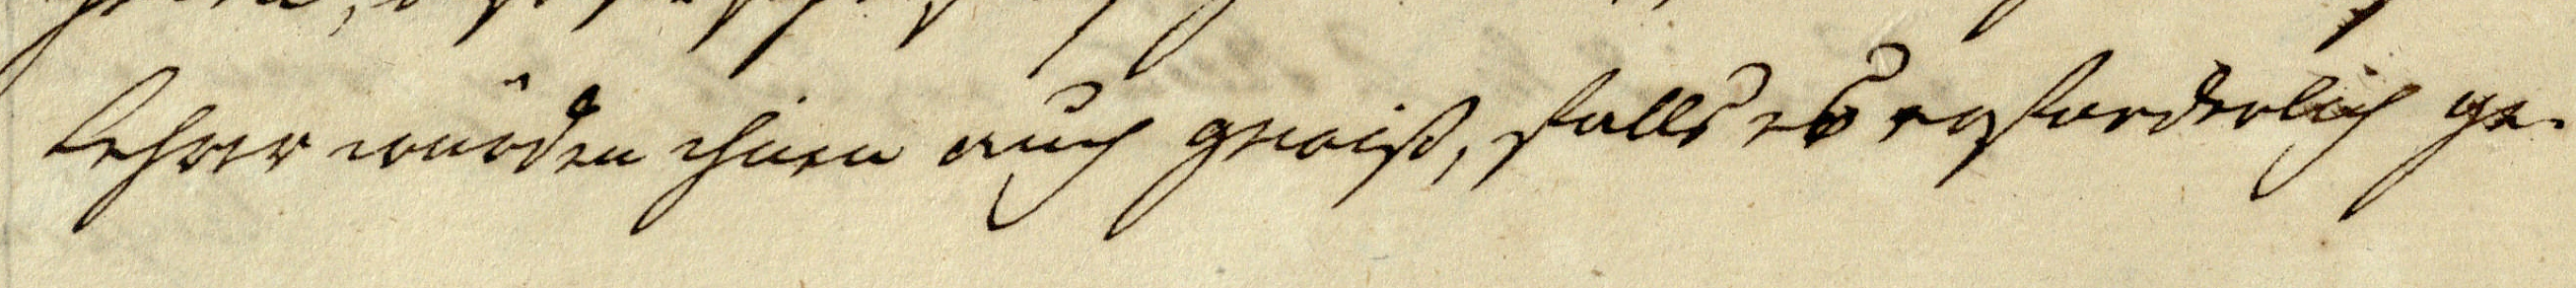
Lehrer würden ihnen auch gewiß, falls es erforderlich ge¬
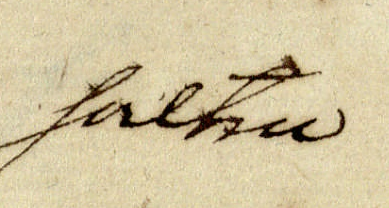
halten
